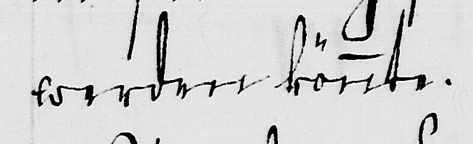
werden könnte.
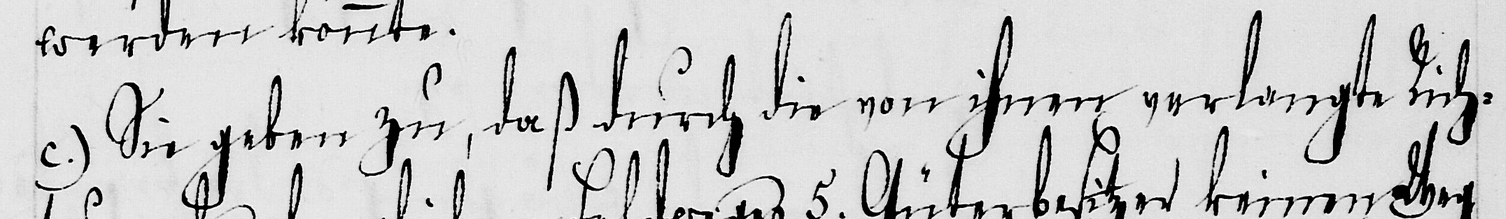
c.) Sie geben zu, daß durch die von ihnen verlangte Ric¬
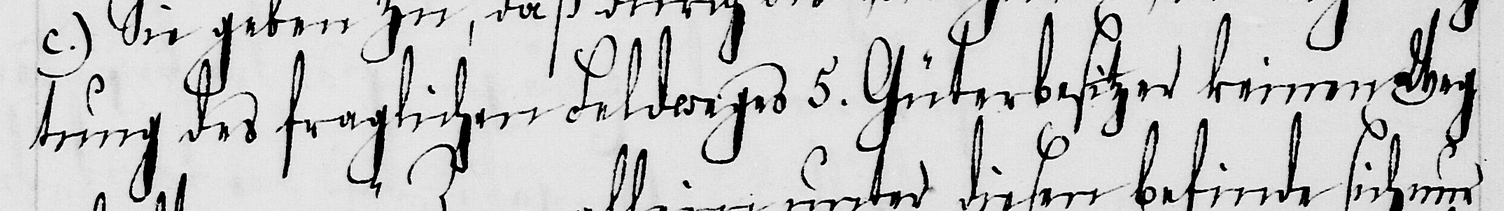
htung des fraglichen Feldweges 5. Güterbesitzer keinen Weg
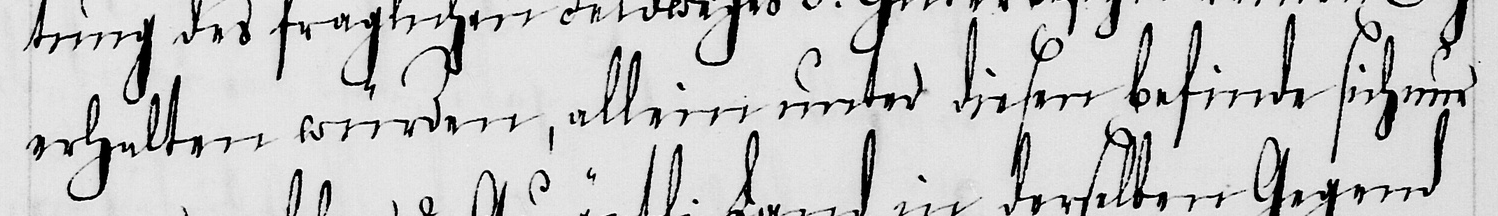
erhalten würden, allein unter diesen befinde sich nur
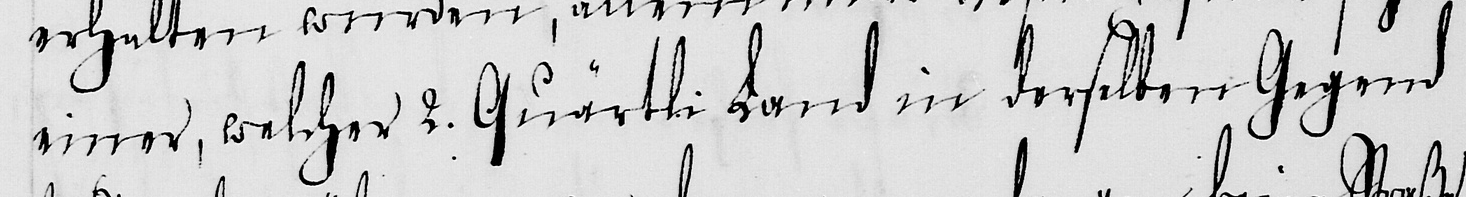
einer, welcher 2. Quärtli Land in derselben Gegend
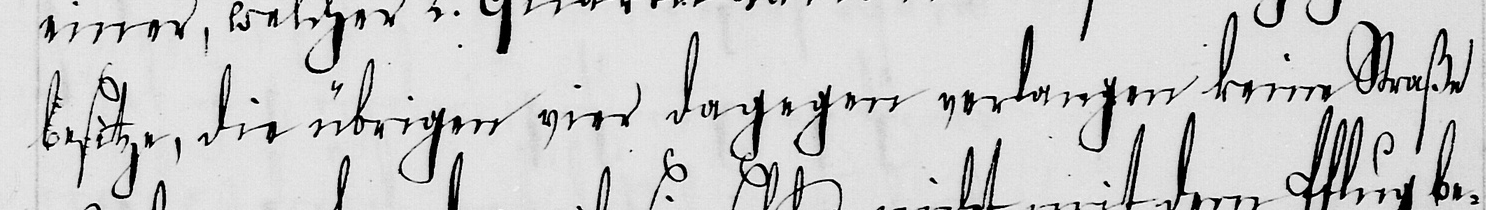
besitze, die übrigen vier dagegen verlangen keine Straße
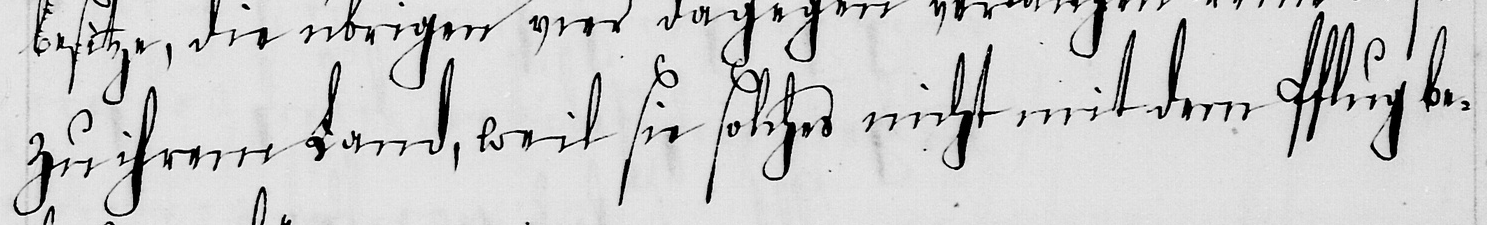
zu ihrem Land, weil sie solches nicht mit dem Pflug be¬
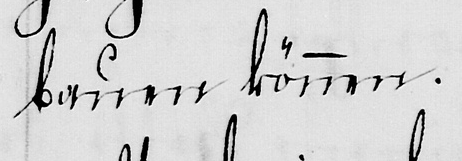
bauen können.
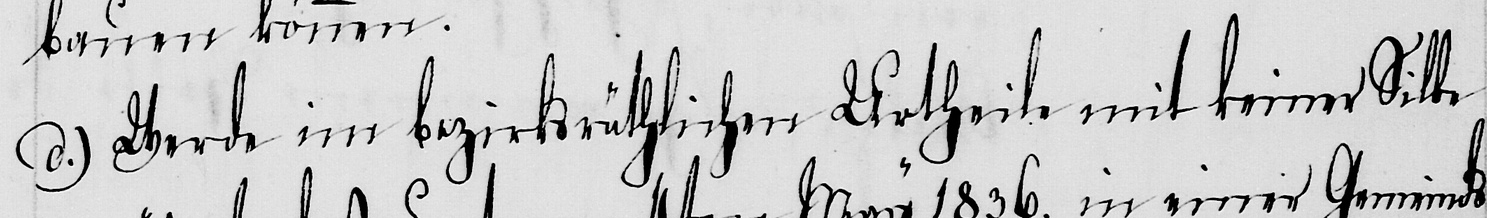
d.) Werde im bezirksräthlichen Urtheile mit keiner Silbe
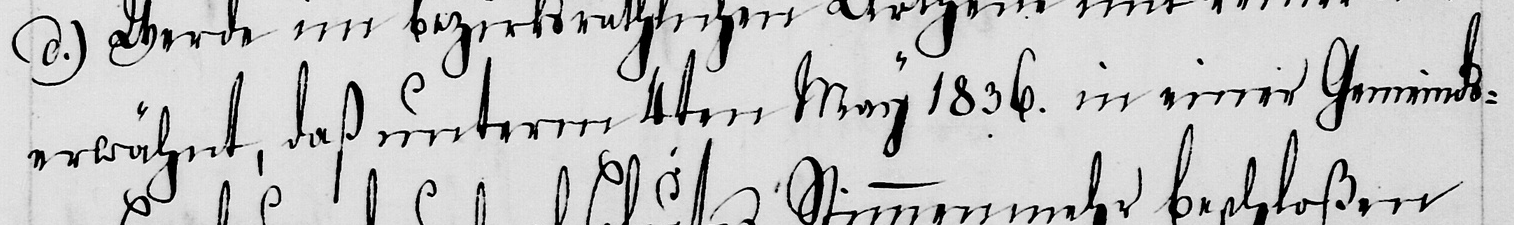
erwähnt, daß unterm 4ten May 1836. in einer Gemeinds¬
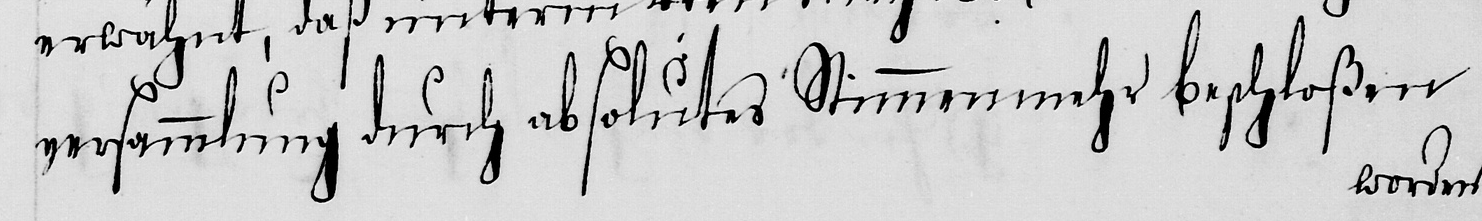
versammlung durch absolutes Stimmenmehr beschloßen
